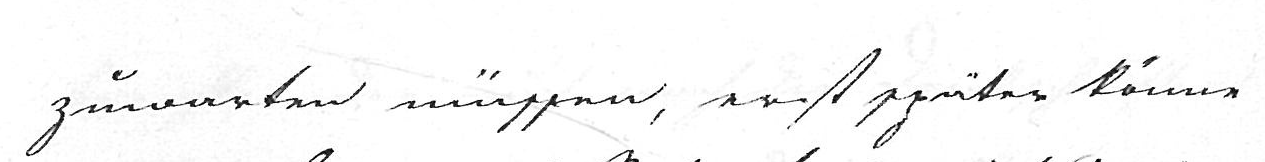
zuwarten müssen, erst später könne
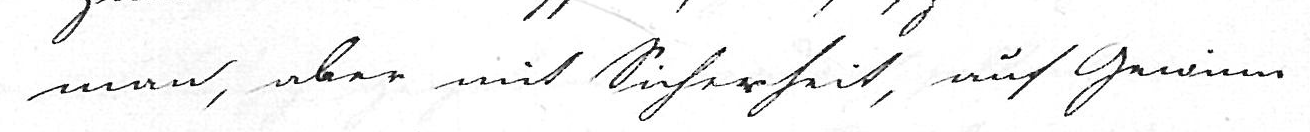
man, aber mit Sicherheit, auf Gewinn
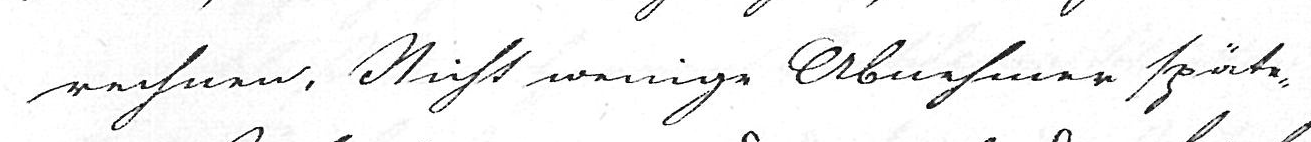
rechnen. Nicht wenige Abnehmer späte-
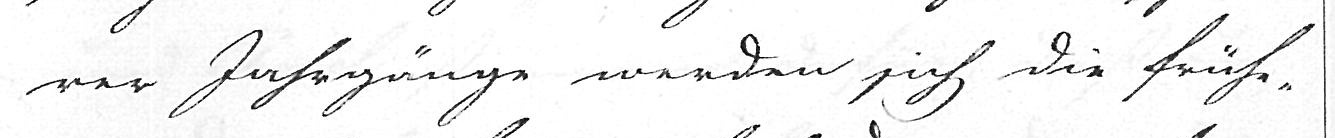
rer Jahrgänge werden sich die frühe-
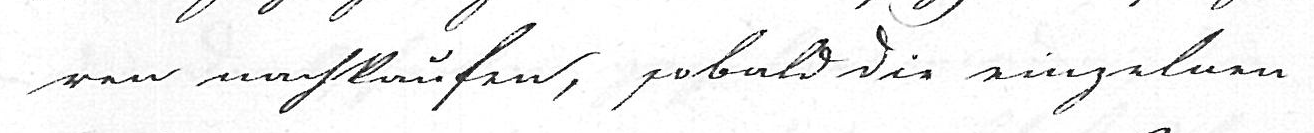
ren nachkaufen, sobald die einzelnen
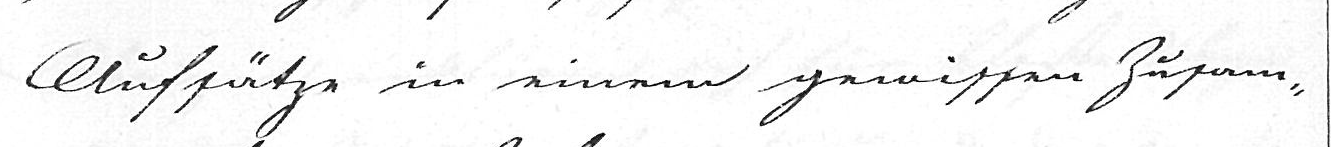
Aufsätze in einem gewissen Zusam-
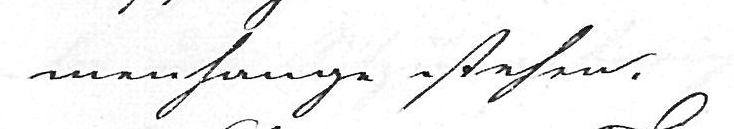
menhange stehen.
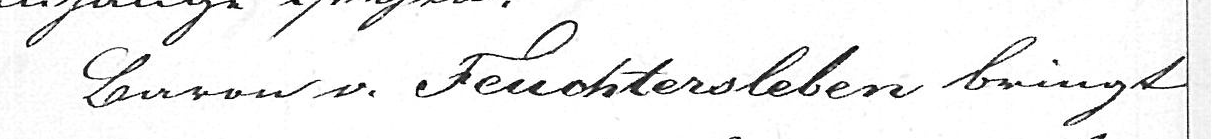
Baron v. Feuchtersleben bringt
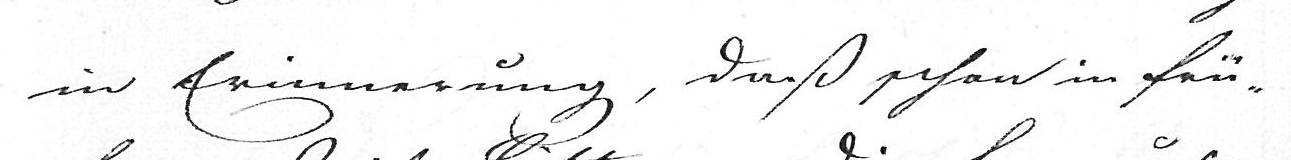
in Erinnerung, daß schon in frü-
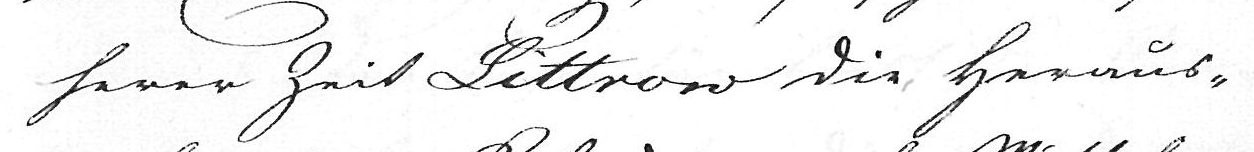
herer Zeit Littrow die Heraus-
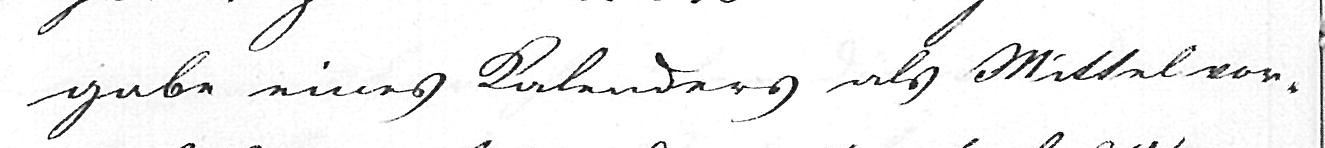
gabe eines Kalenders als Mittel vor-
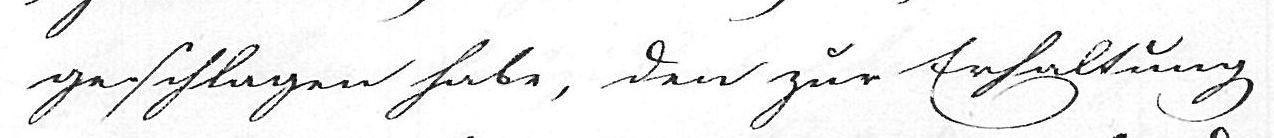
geschlagen habe, den zur Erhaltung
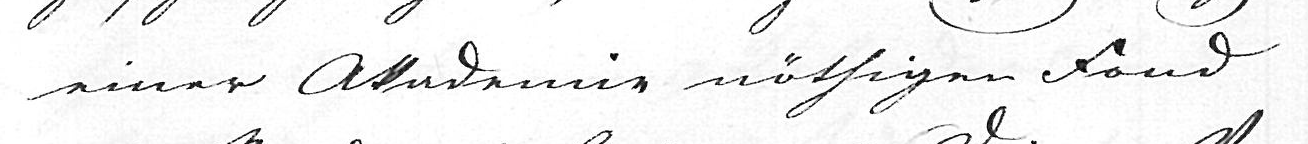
einer Akademie nöthigen Fond
